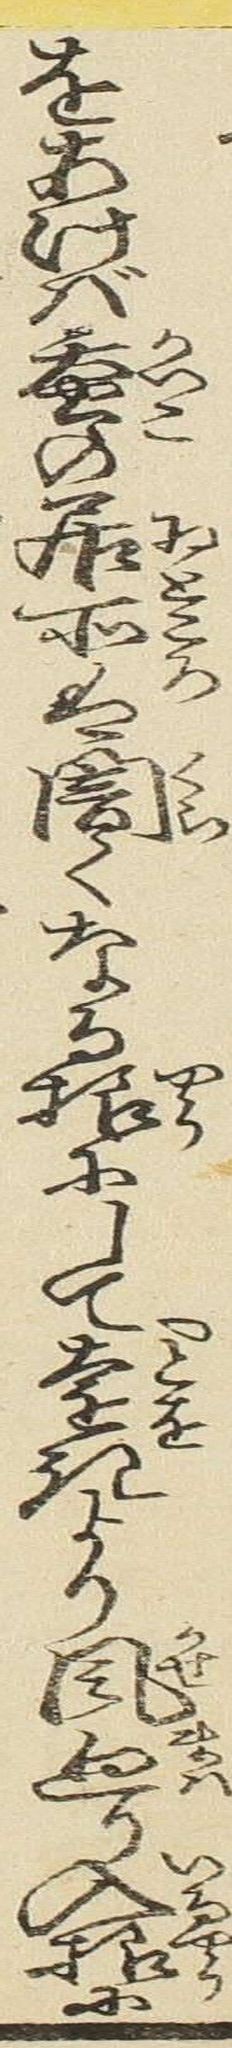をあけば蚕の居所は闇くなる様にして。遠きより風廻り入様に
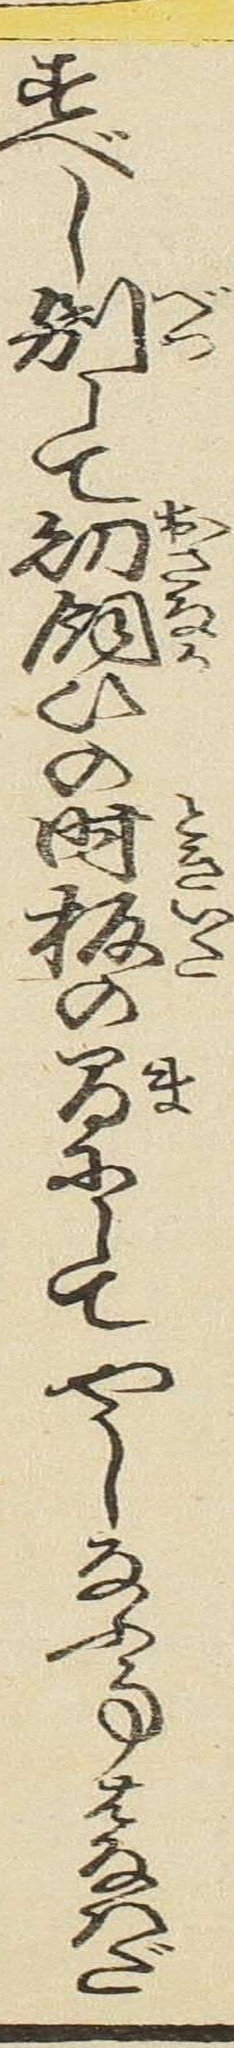すべし別して初飼ひの時板の間にしてやしなふ事はなはだ
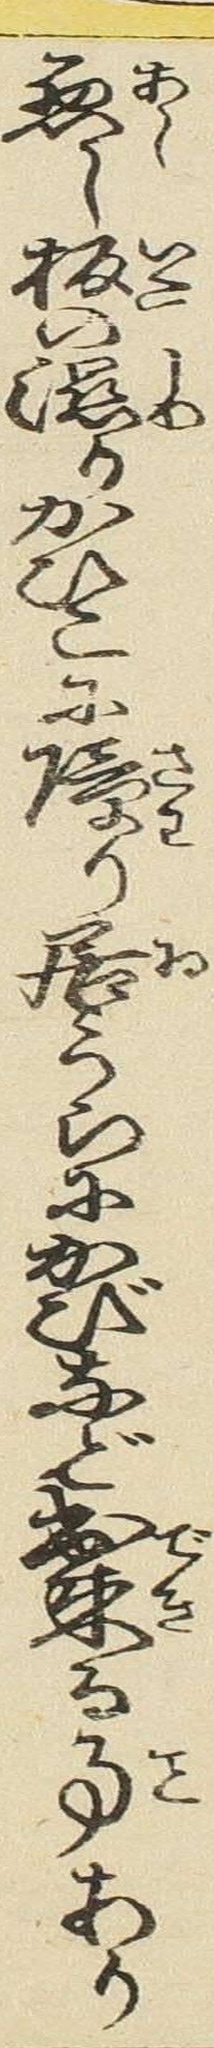悪し板の湿りかひこに障り居うらにかびなど出来る事あり
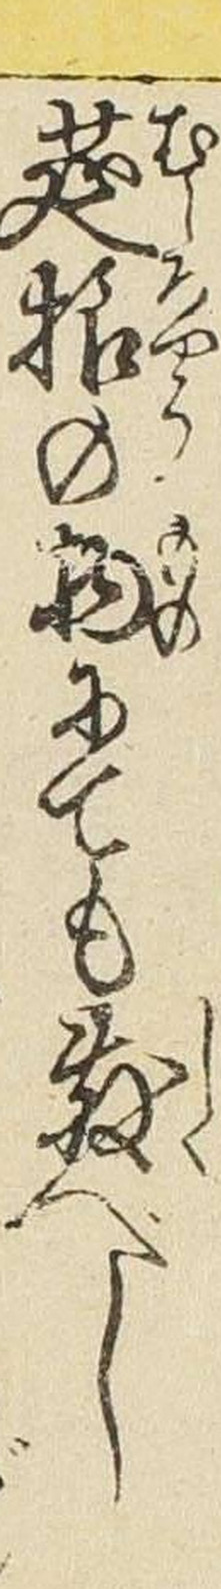莚様の物にても敷べし
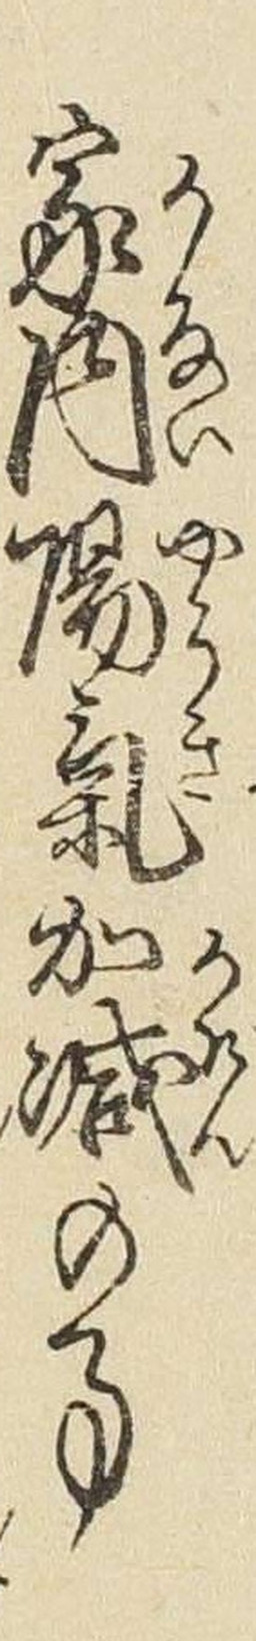家内陽気加減の事
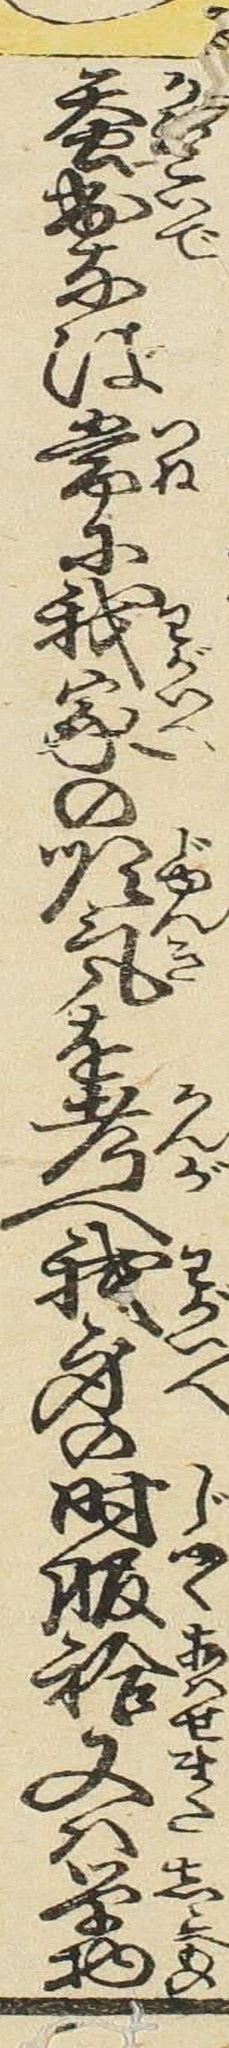蚕出なは常に我家の順気を考へ我身の時服袷又は単物
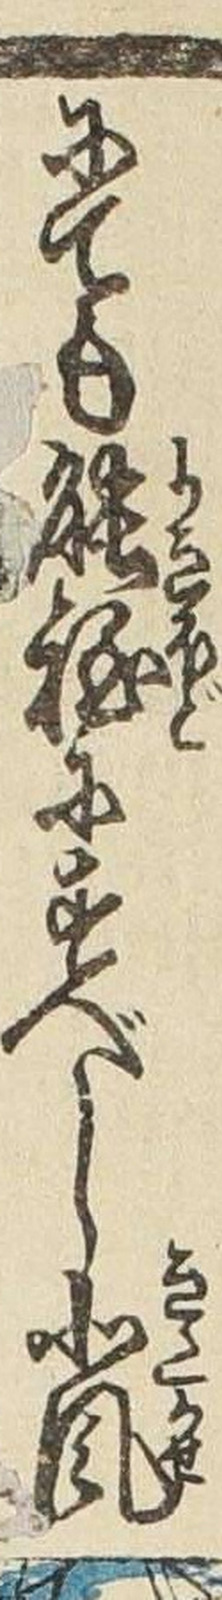にても能程にすべし北風
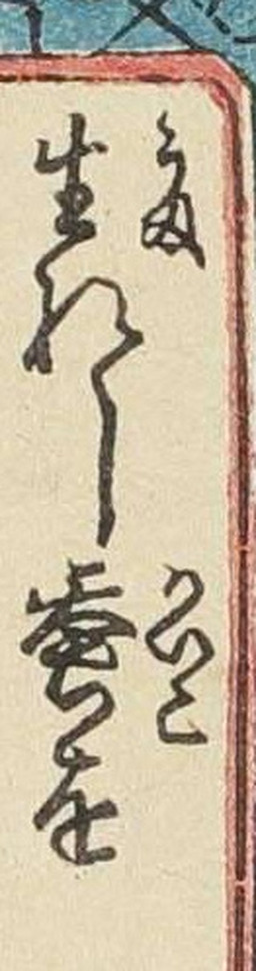生れし蚕を
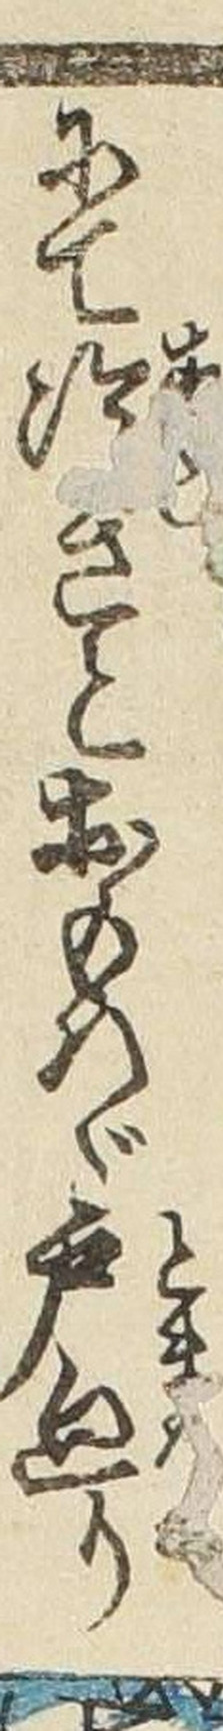にて冷きとおもはゞ戸廻り
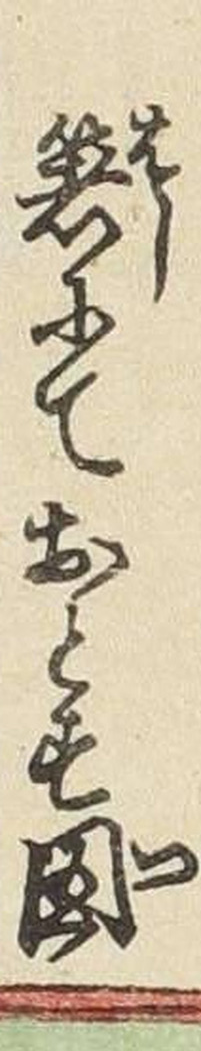箸にておとす図
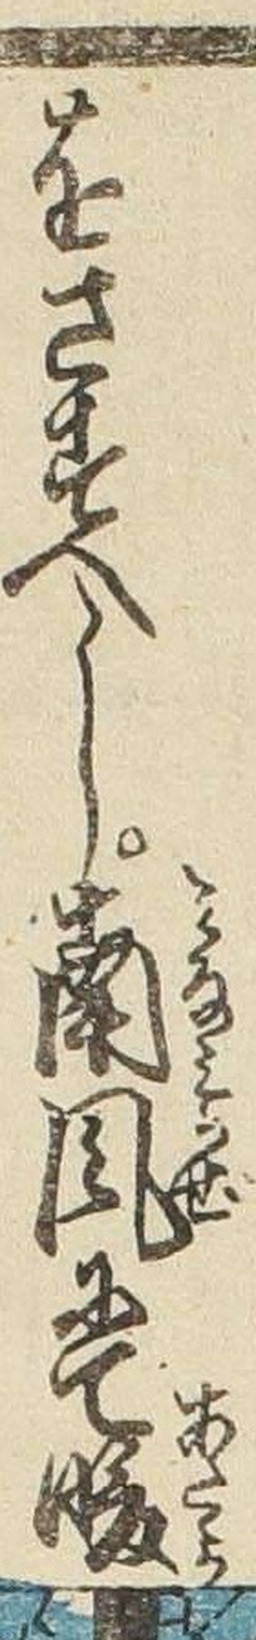をさすへし。南風にて暖
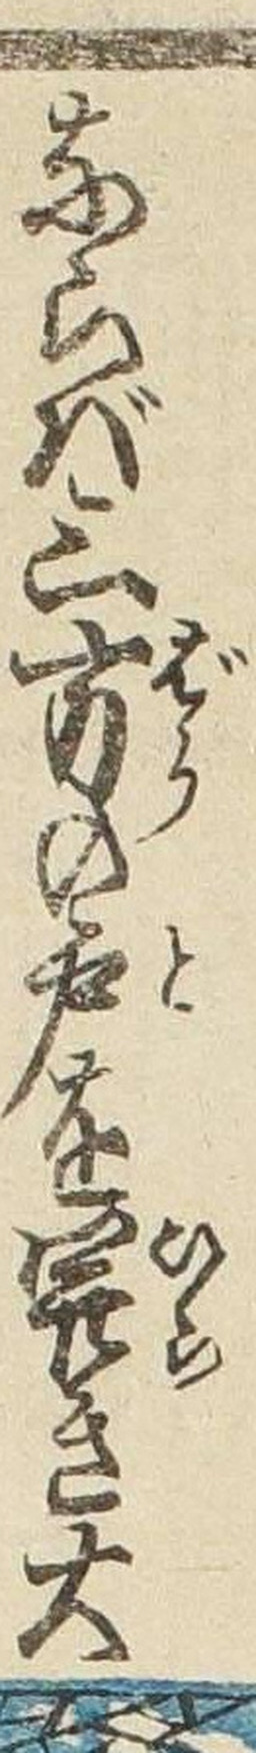ならば三方の戸を開き大
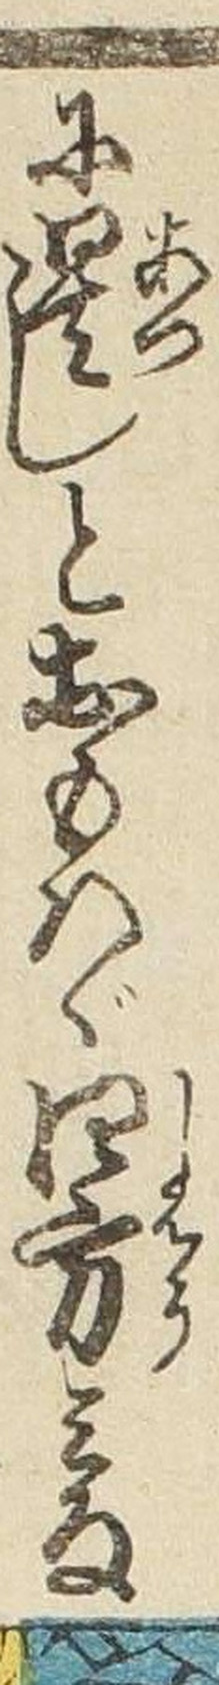に暑しとおもはゞ四方みな
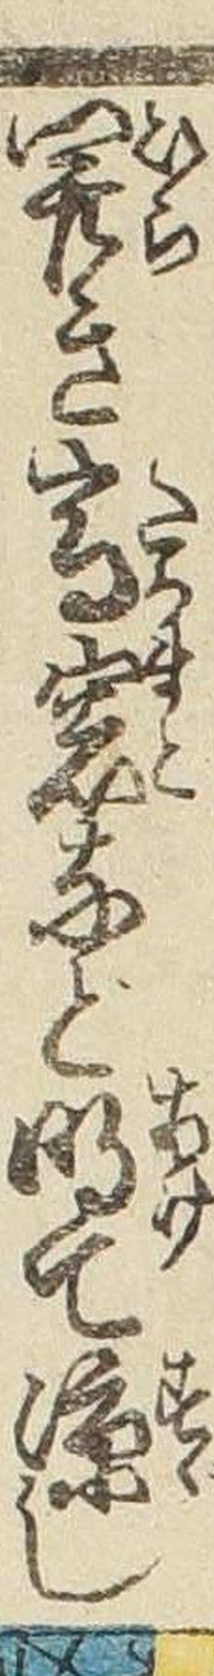開き高窓なと明て涼し
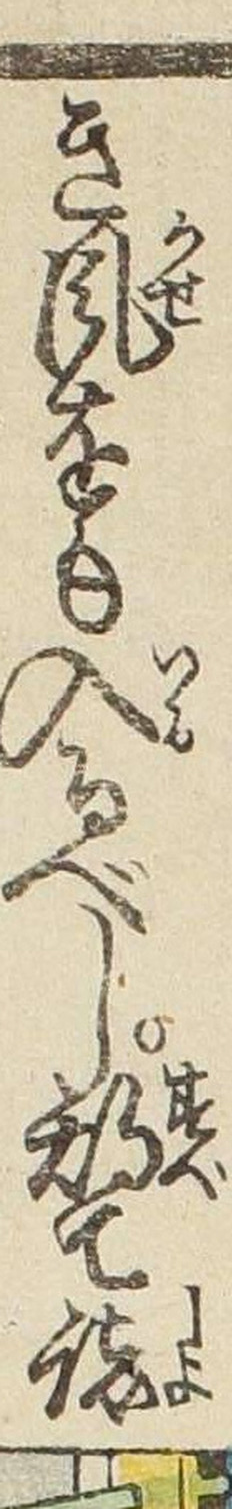き風をも入るべし。都て諸
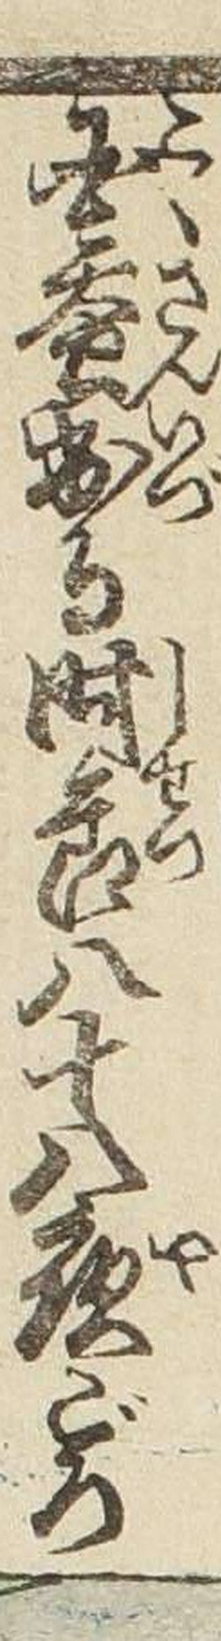国蚕出る時節八十八夜ごろ
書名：養蠶圖解
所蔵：東京大学農学生命科学図書館 国文学研究資料館
